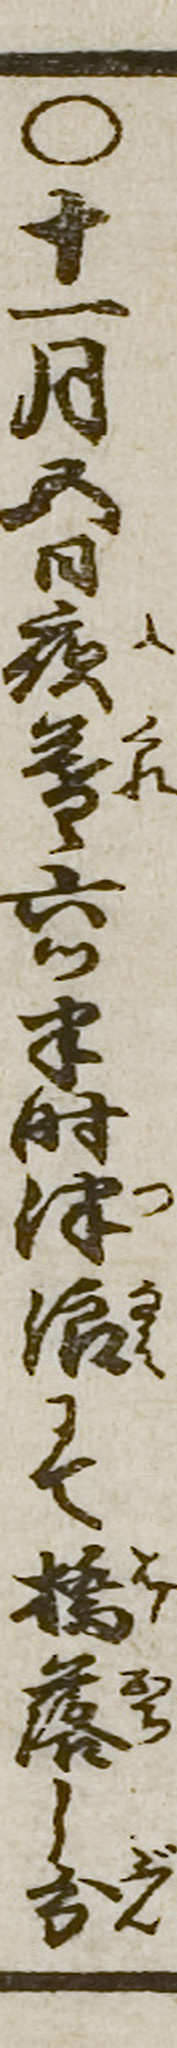〇十一月五日夜暮六ツ半時津浪にて橋落し分
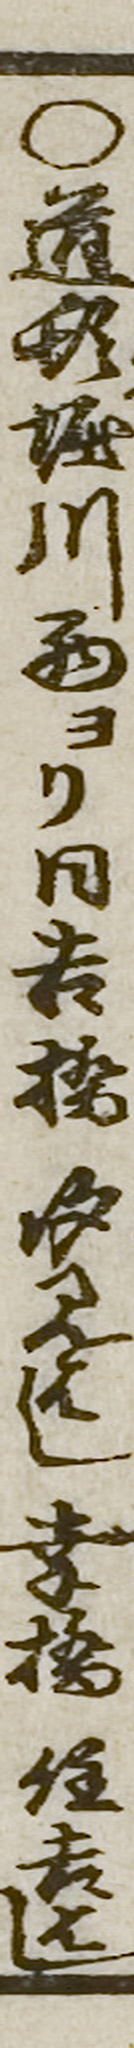〇道頓堀川西より日吉橋汐見はし幸橋住吉はし
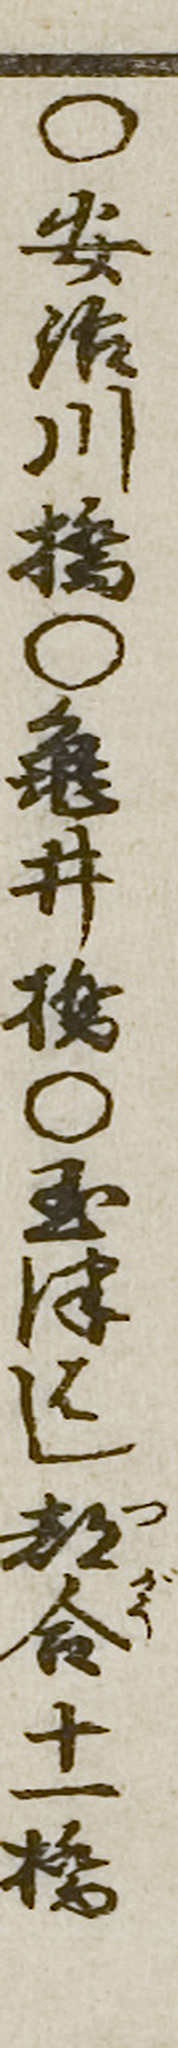〇安治川橋〇亀井橋〇玉津はし都合十一橋
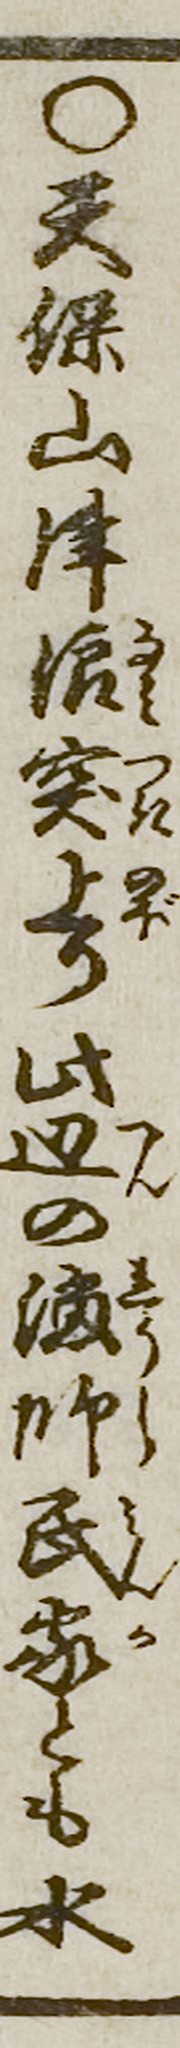〇天保山津浪突上り此辺の漁師民家とも水
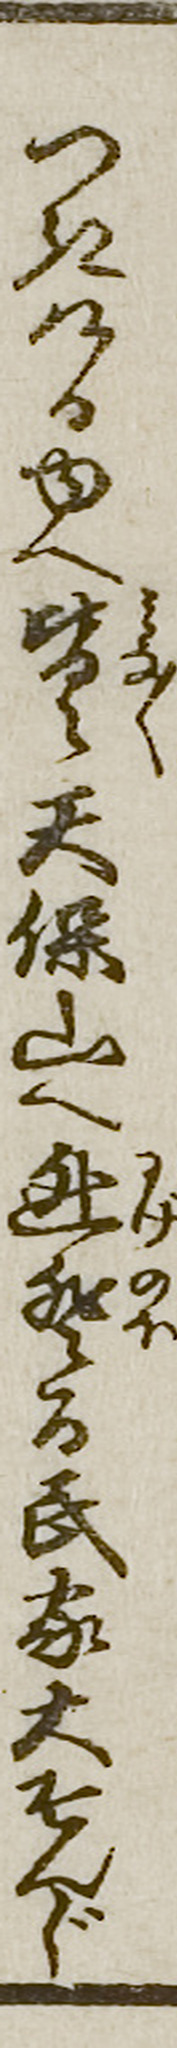つきけるゆへ皆々天保山へ逃登る民家大そんじ
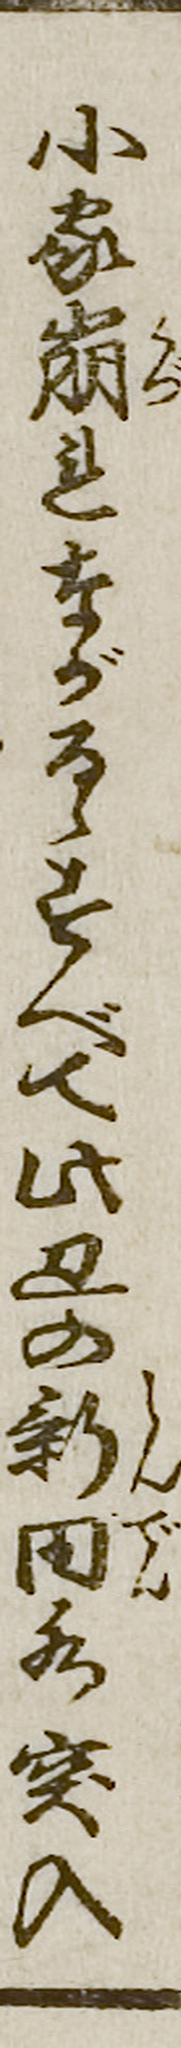小家崩れながるゝすべて此辺の新田水突入
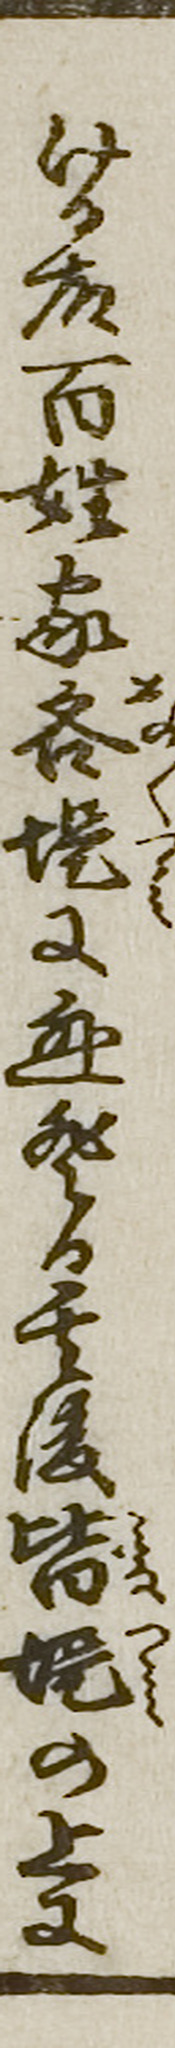ける故百性家各堤に逃登る其後皆堤の上に
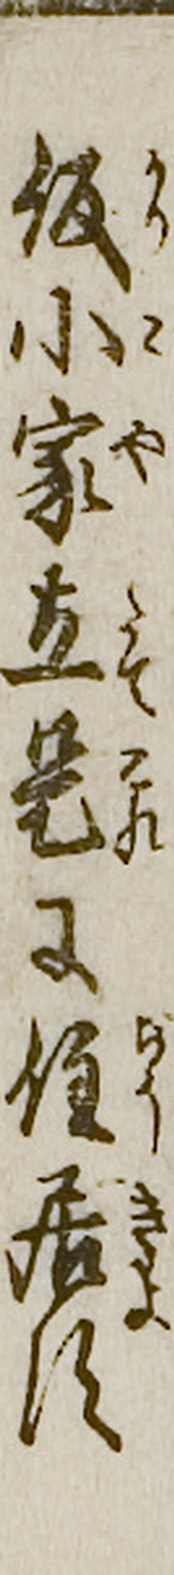仮小家立是に住居す
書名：[十一月五日の夜大津波来ル前 大坂前垂嶋に出る怪異の図]
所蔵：東京大学総合図書館 General Library in the University of Tokyo, JAPAN
